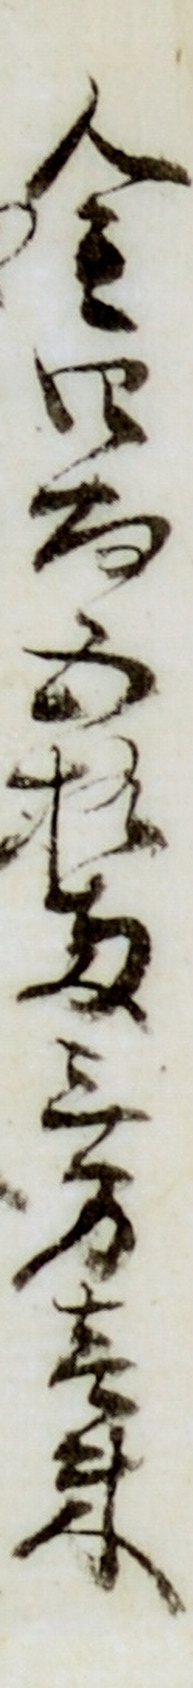一金四百五拾両三分壱朱
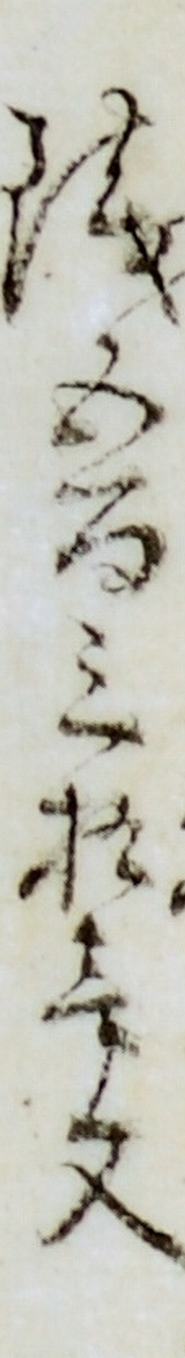銭五百三拾壱文
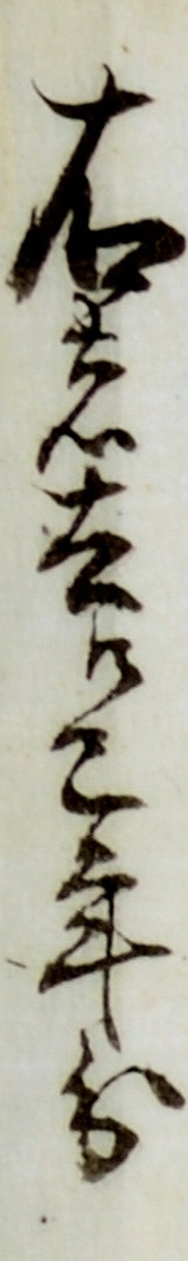右は去ル巳年分
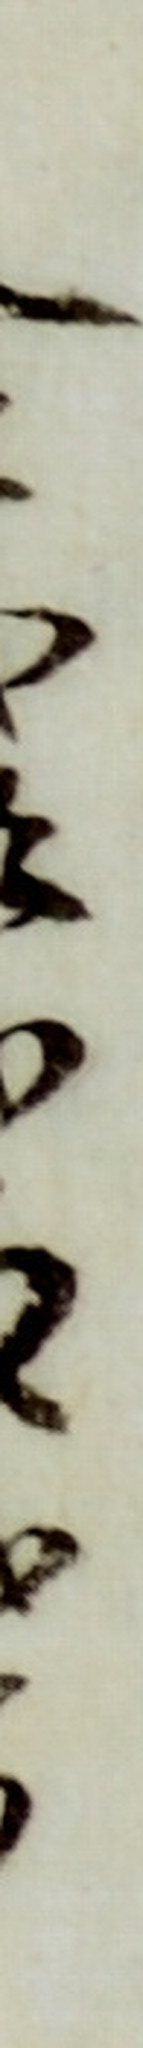一金弐拾弐両弐分

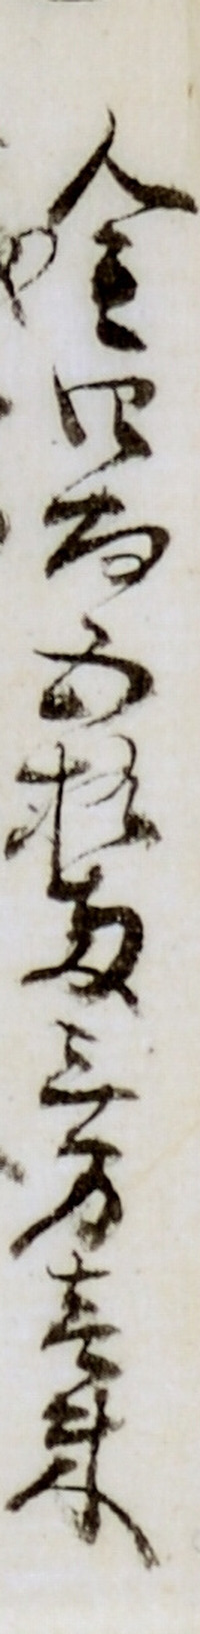一金四百五拾両三分一朱
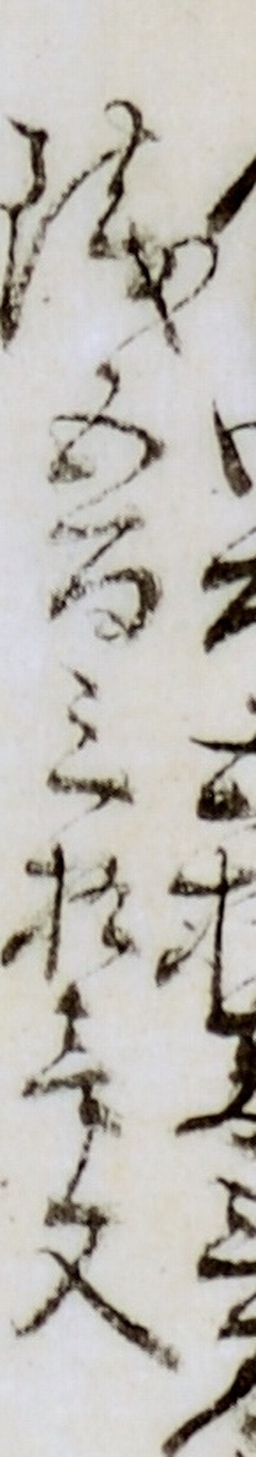銭五百三拾壱文
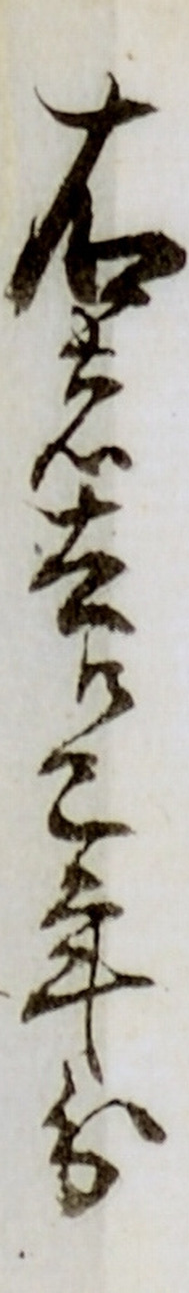右は去ル巳年分
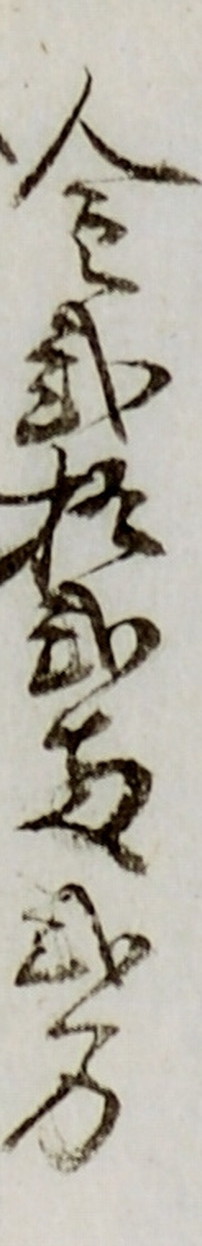一金弐拾弐両弐分
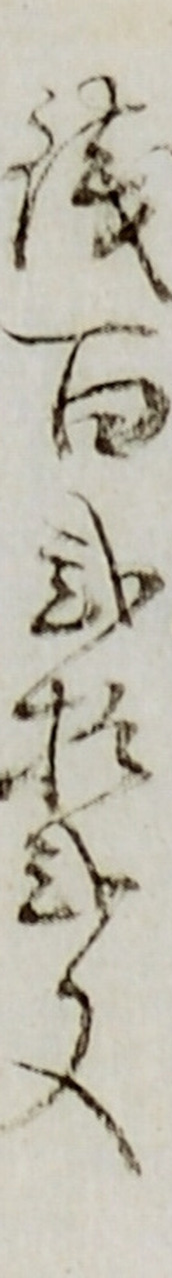銭百弐拾弐文
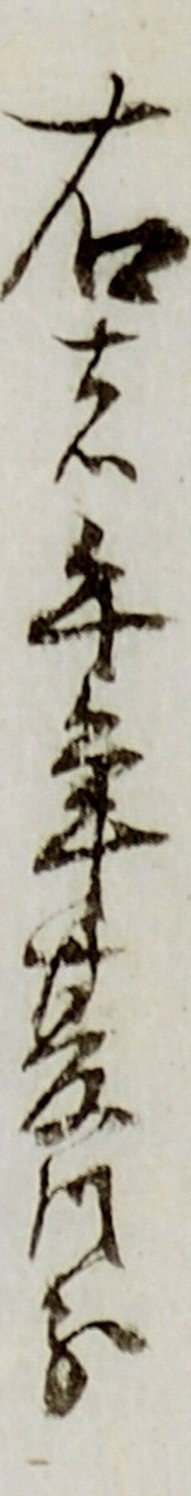右は午年夏川分
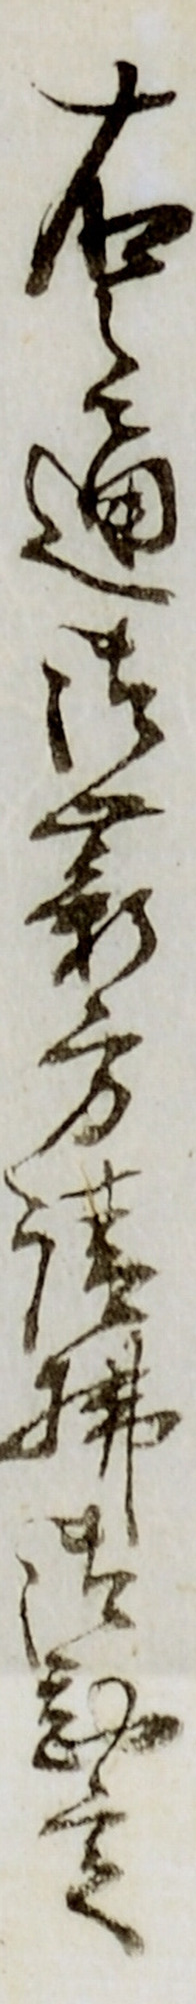右之通御薪方請払御勘定
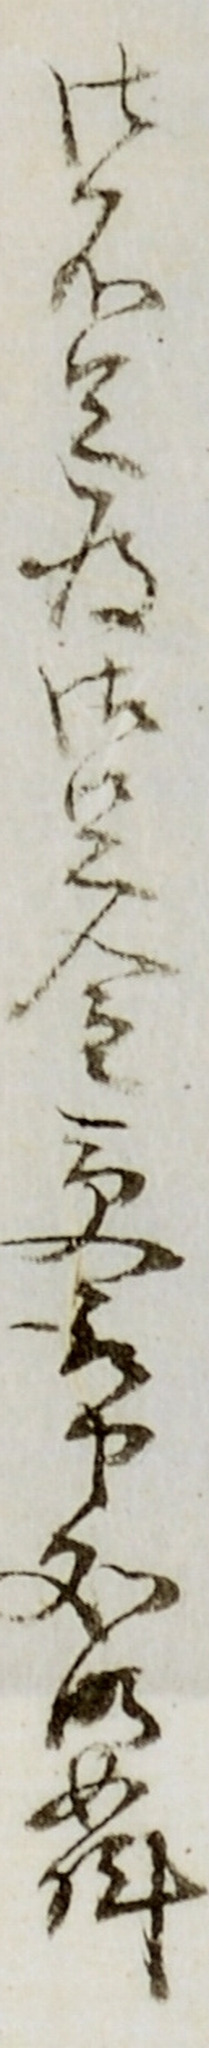御不足為御足金受取申処仍如件
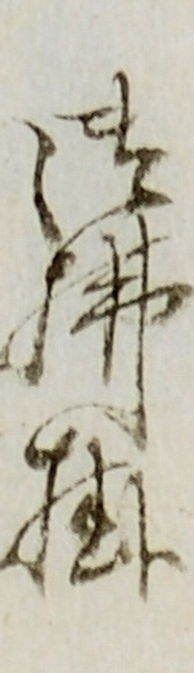御払掛

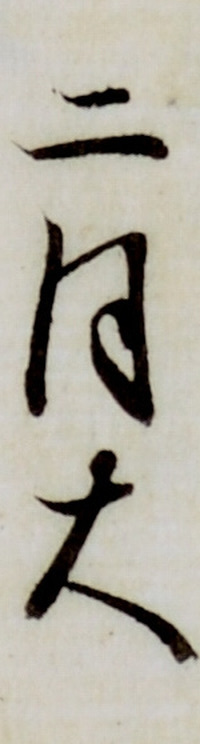二月大
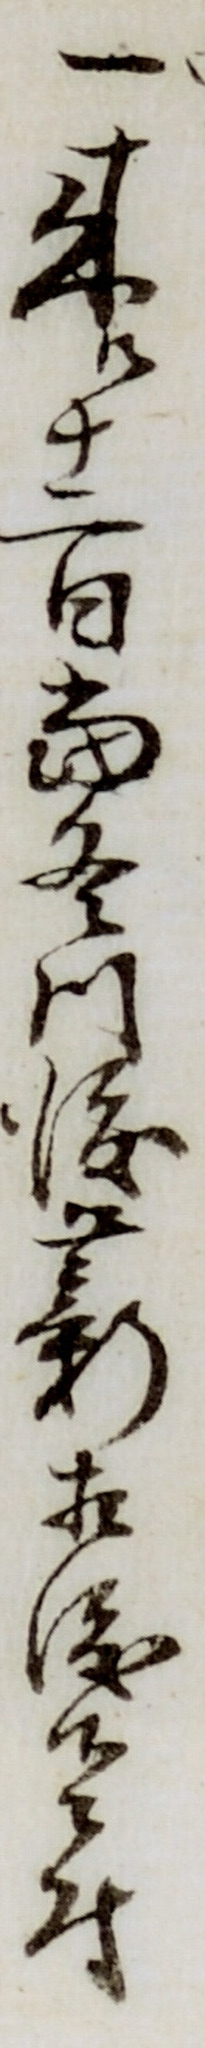一来ル十二日当冬川渡薪相渡候に付
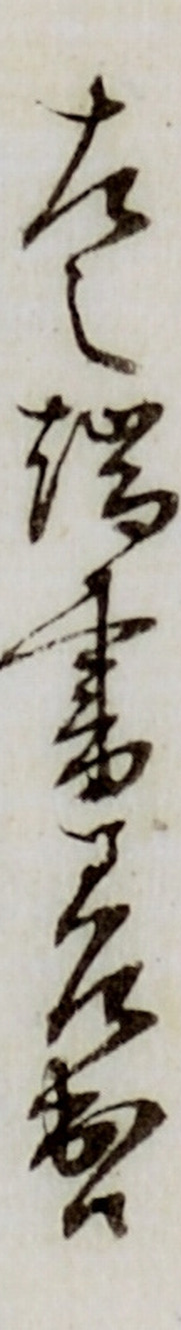左之端書差出候
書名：山林方諸事御用留
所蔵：伊那市立高遠町図書館・合同会社AMANE
